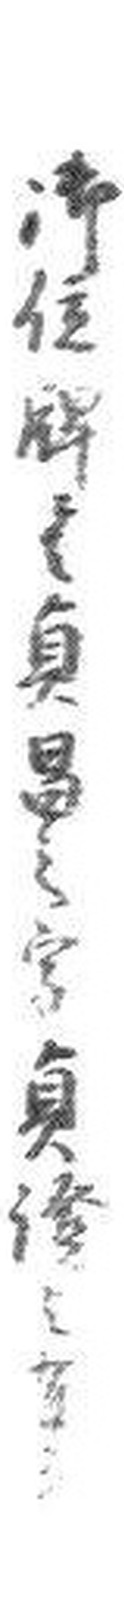御位牌ニ者貞昌之字貞澄と有之
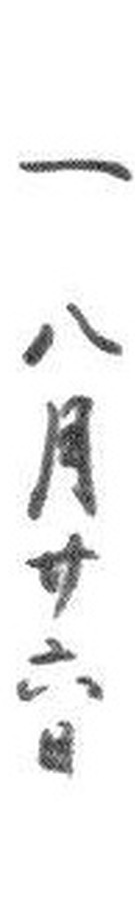一八月廿六日

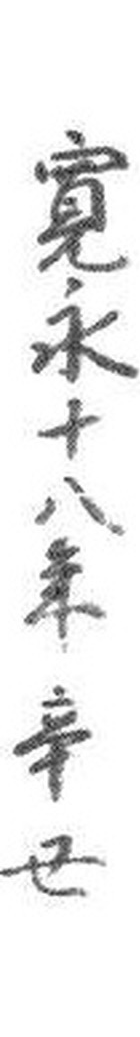寛永十八年辛丑
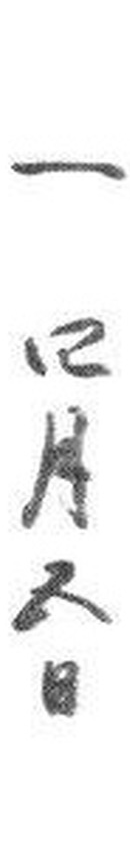一四月五日
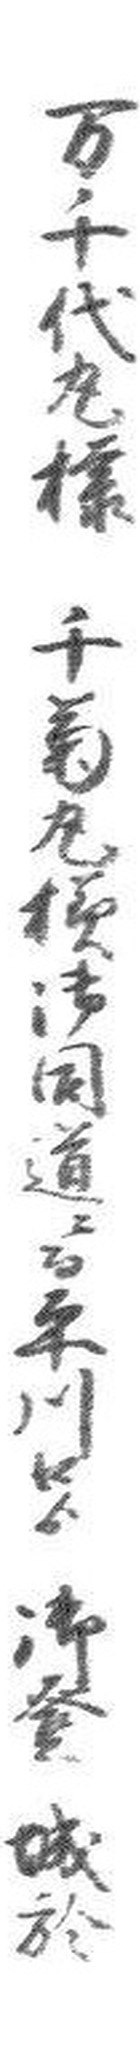万千代丸様千菊丸様御同道ニ而平川口ゟ御登城於
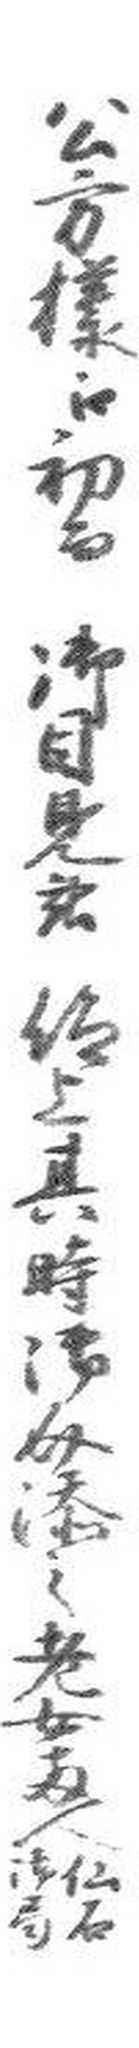公方様江初而御目見被仰上其時御介添之老女両人仙石御局
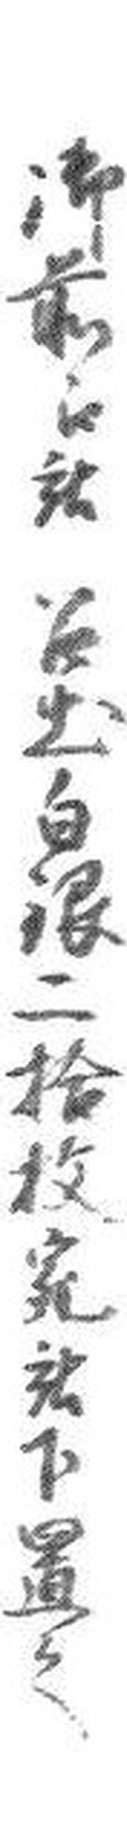御前江被召出白銀二拾枚宛被下置之
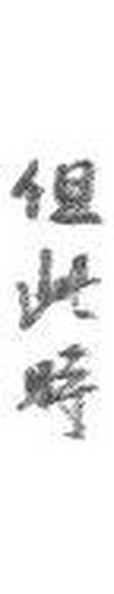但此時
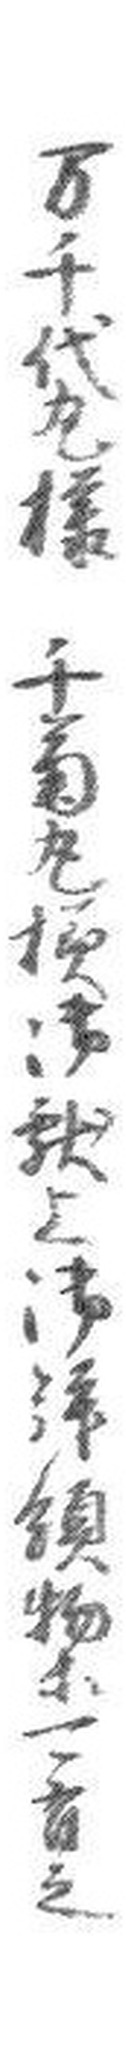万千代丸様千菊丸様御献上御拝領物等可有之

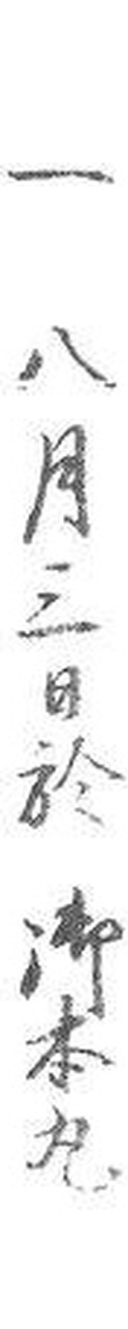一八月三日於御本丸
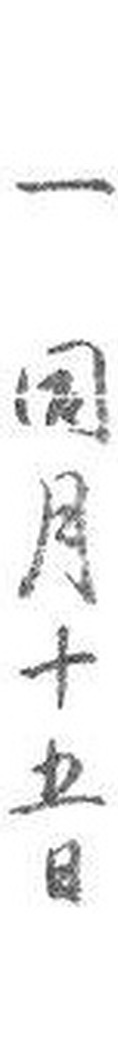一同月十五日
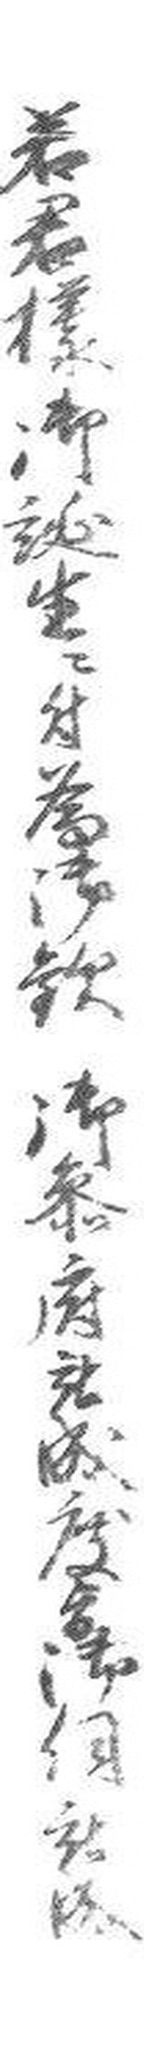若君様御誕生ニ付為御歓御参府被成度旨御伺被成
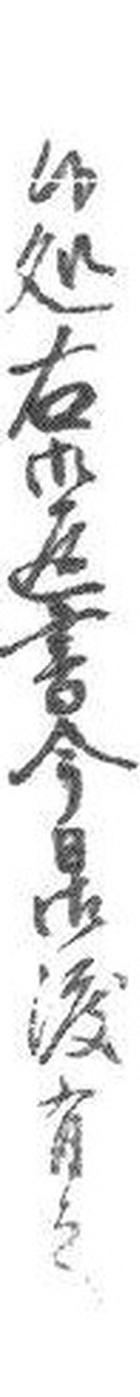候処右御返書今日御渡有之
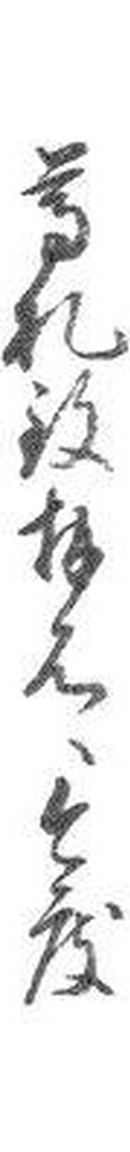尊札致拝見候今度
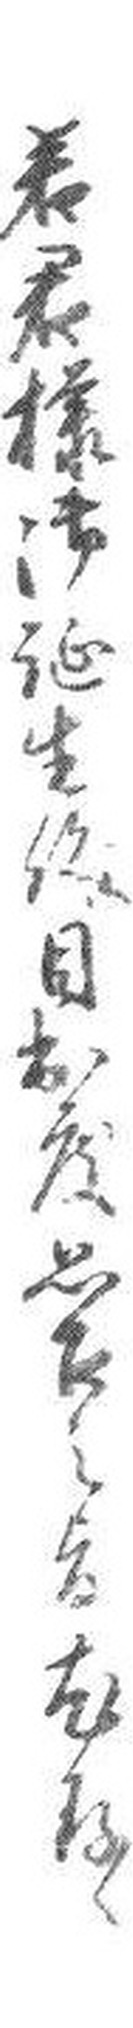若君様御誕生儀目出度思召候旨尤存候
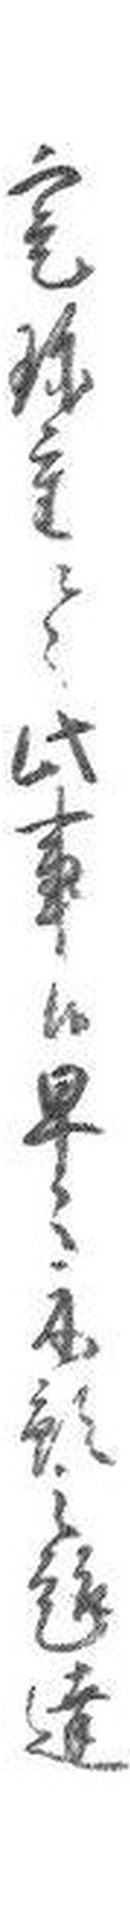寔珎重々々此事候早々示預之趣達
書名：家譜 四 忠昌公 従寛永七年到正保四年
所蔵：福井県文書館 Fukui Prefectural Archives
